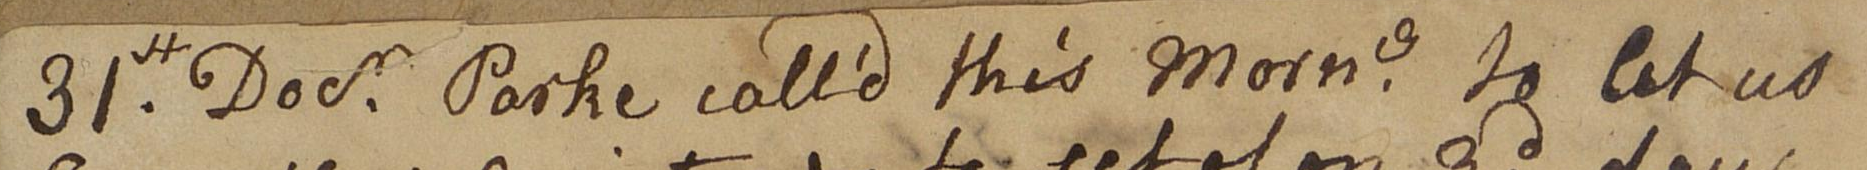31^st. Doc^r. Parke call'd this Morn^g. to let us
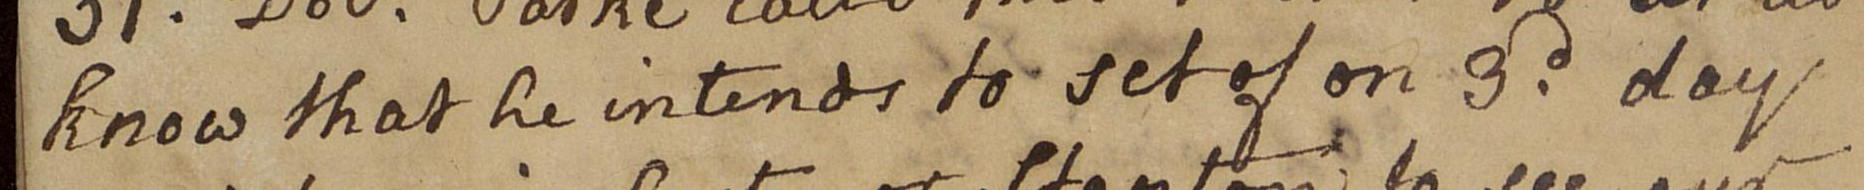know that he intends to set of on 3^d. day
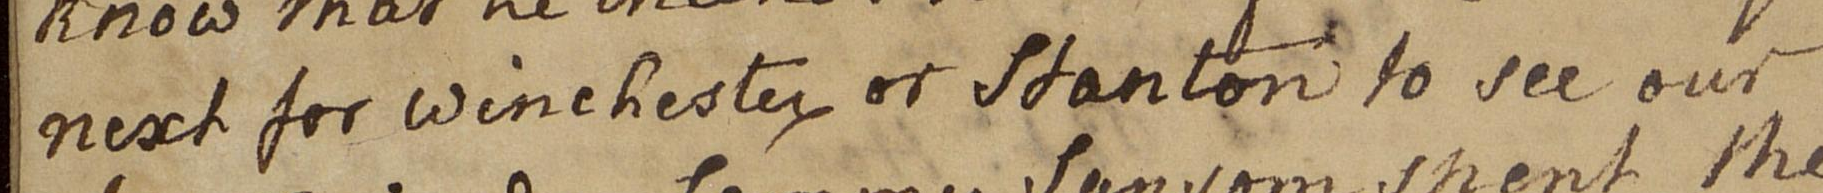next for Winchester at Stanton to see our
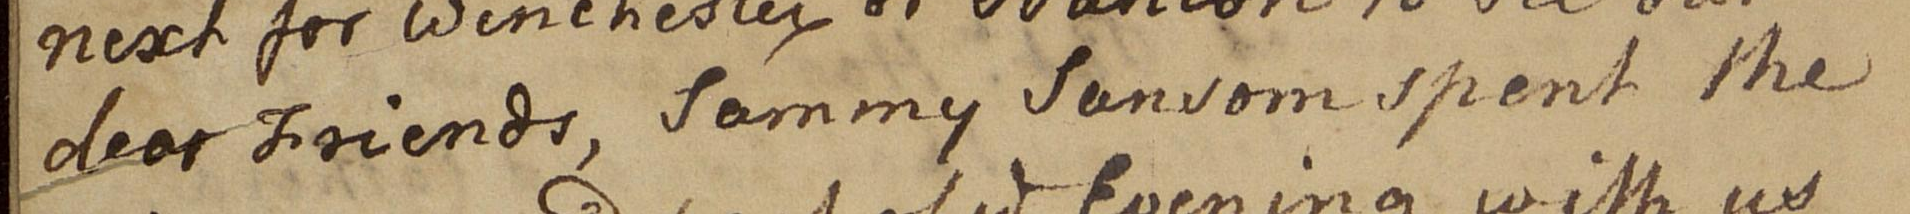dear Friends, Sammy Sansom spent the
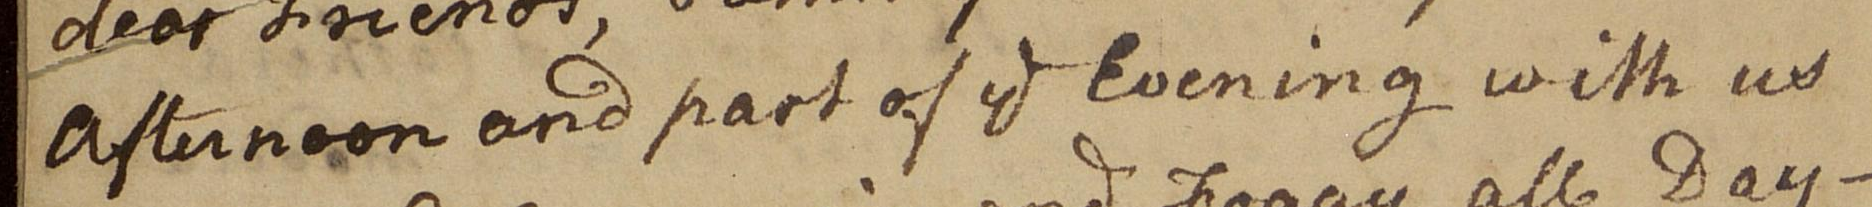Afternoon and part of y^e Evening with us
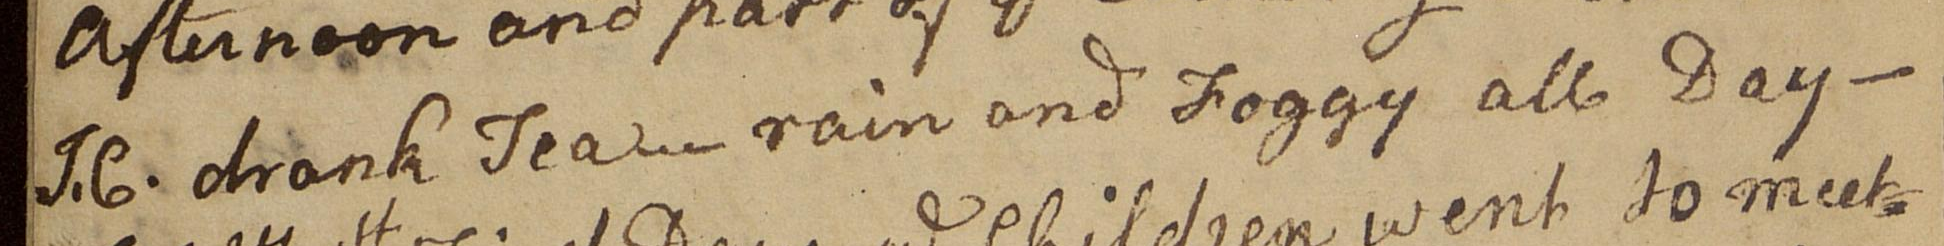J.C. drank Tea- rain and Foggy all Day-
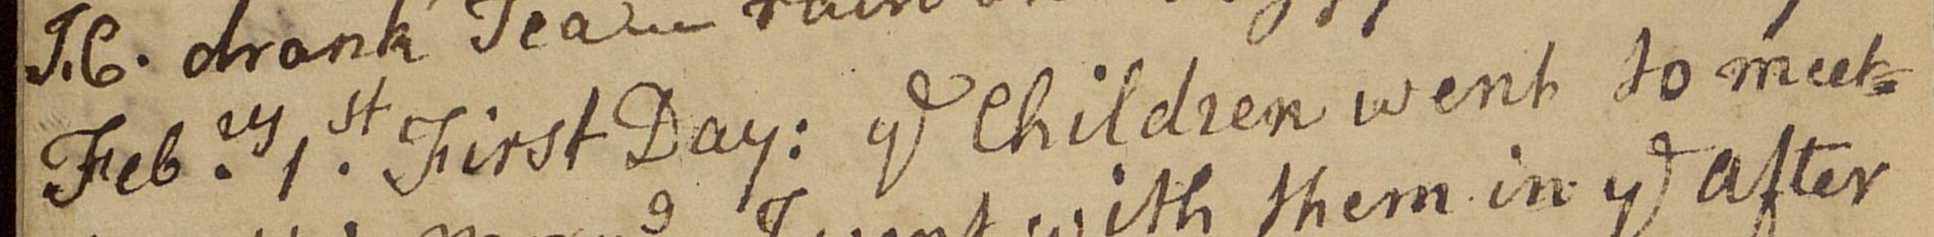Feb^24. 1^st. First Day: y^e Children went to meet-
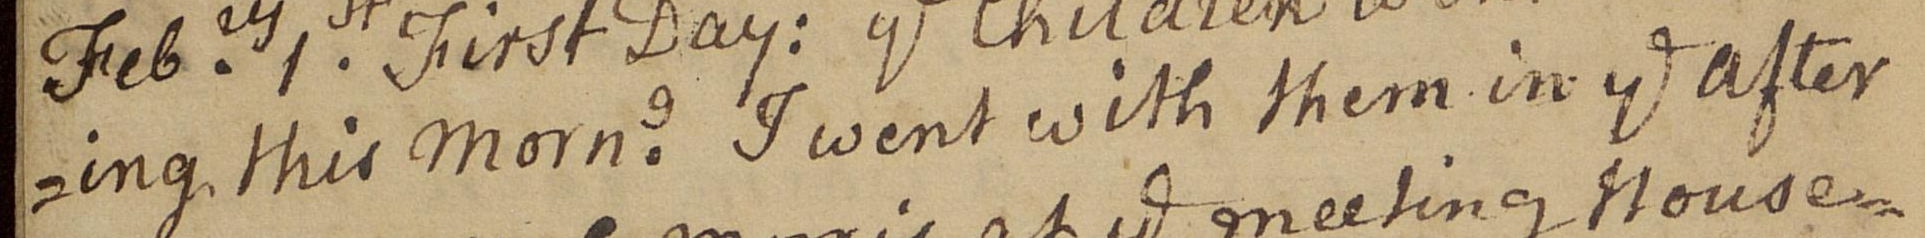-ing, this morn^g. I went with them in y^e After
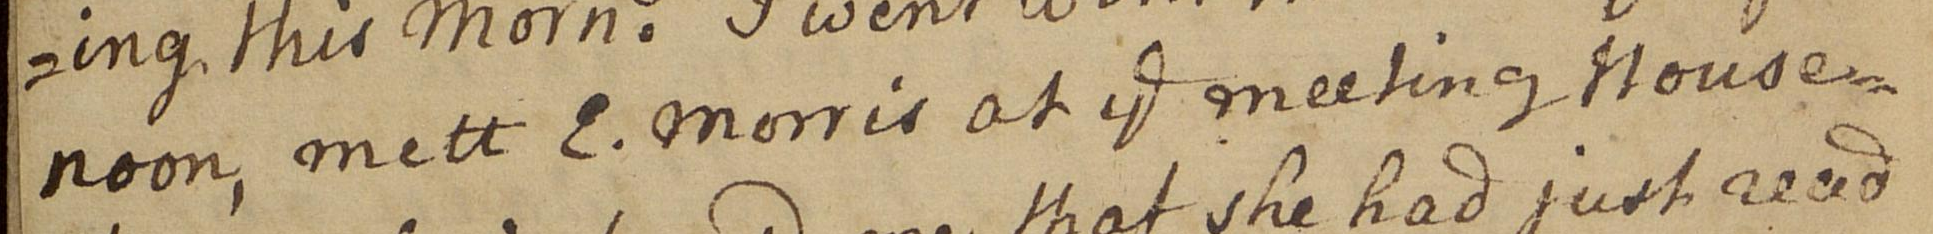noon, mett E. Morris at y^e meeting House-
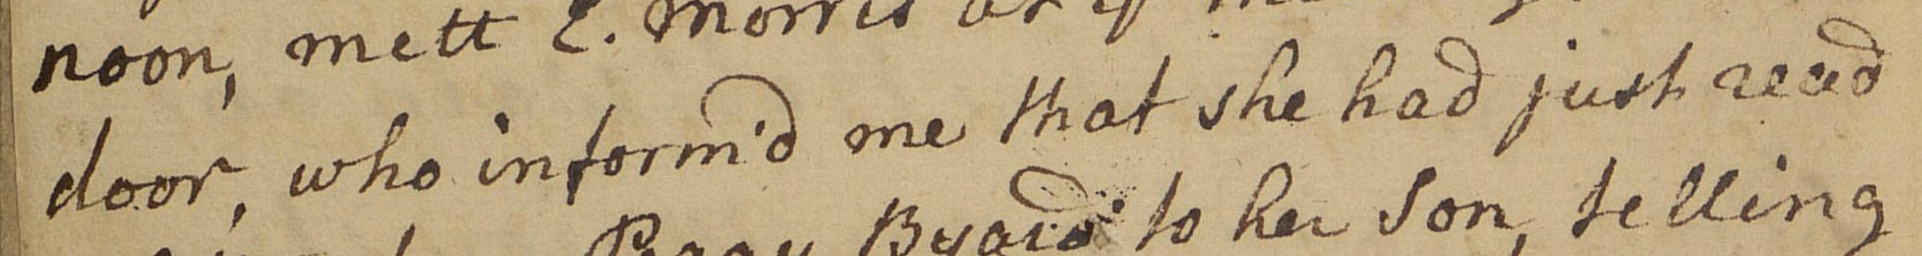door, who inform'd me that she had just read
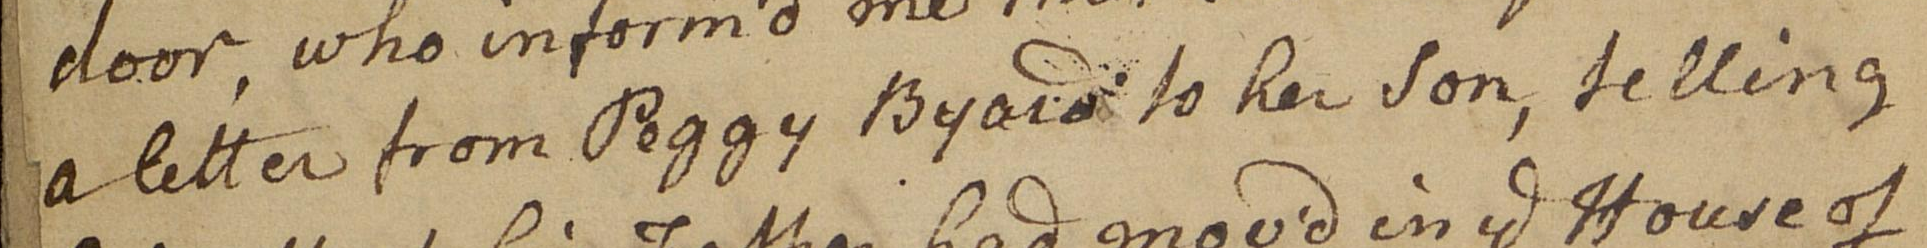a letter from Peggy Byard to her Son, telling
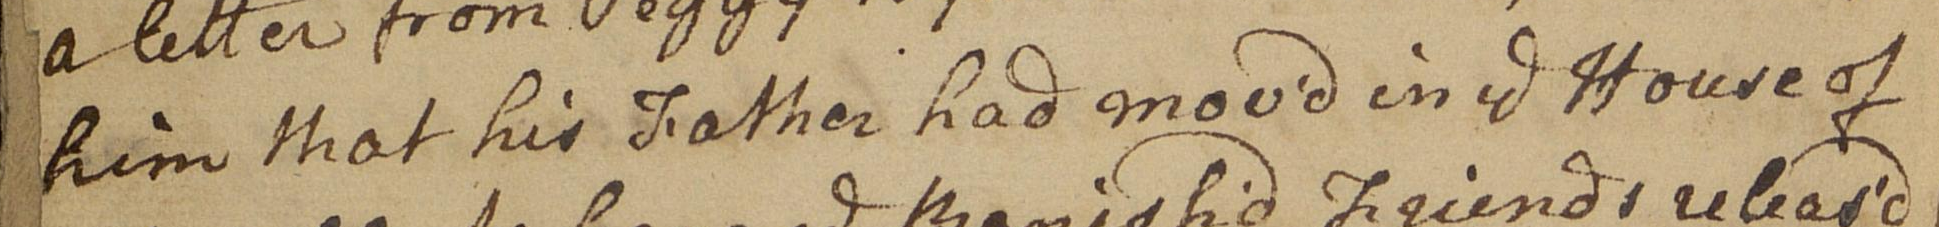him that his Father had mov'd in y^e House of
